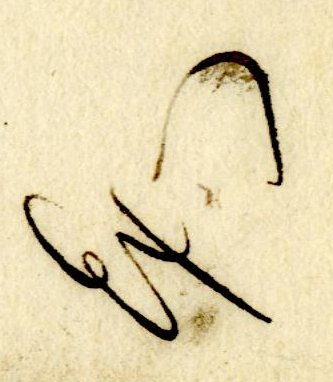Ex
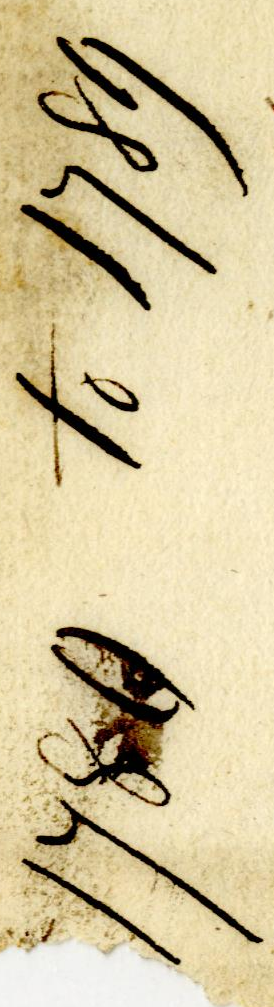1780 to 1780
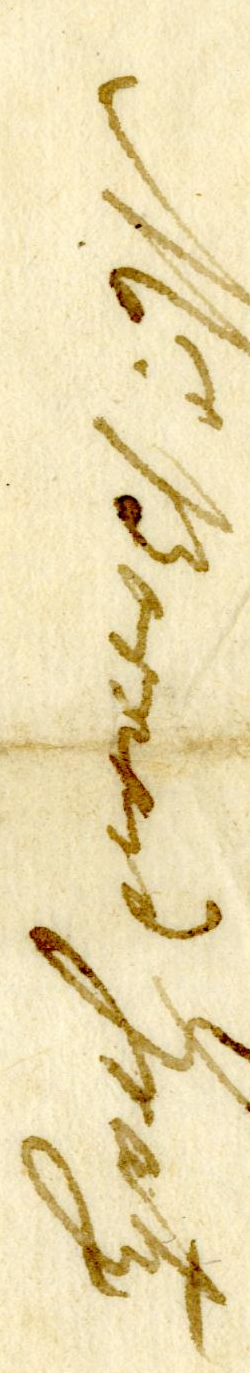M^r Barnard Gratz
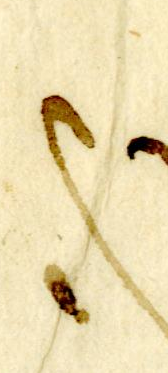To
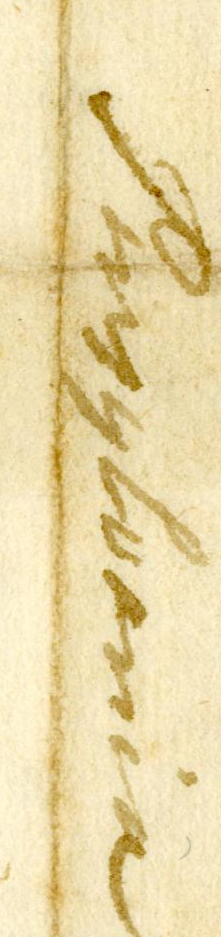Pensylvania
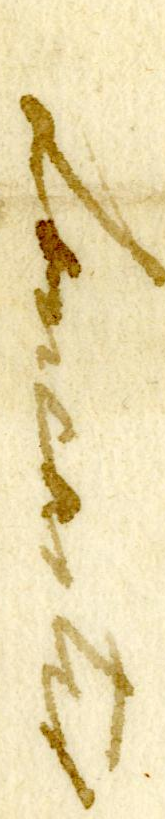Lancaster
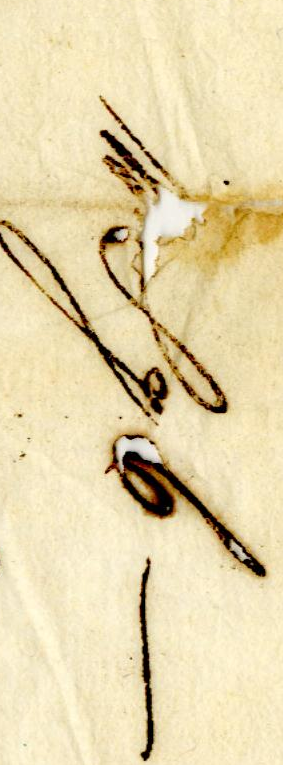M Sq 6.-
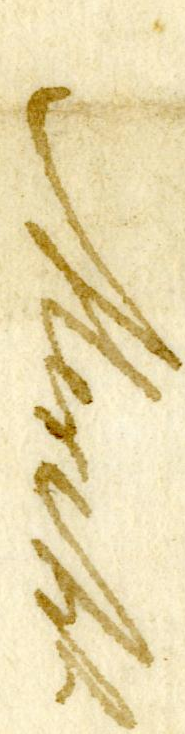Merch^t
